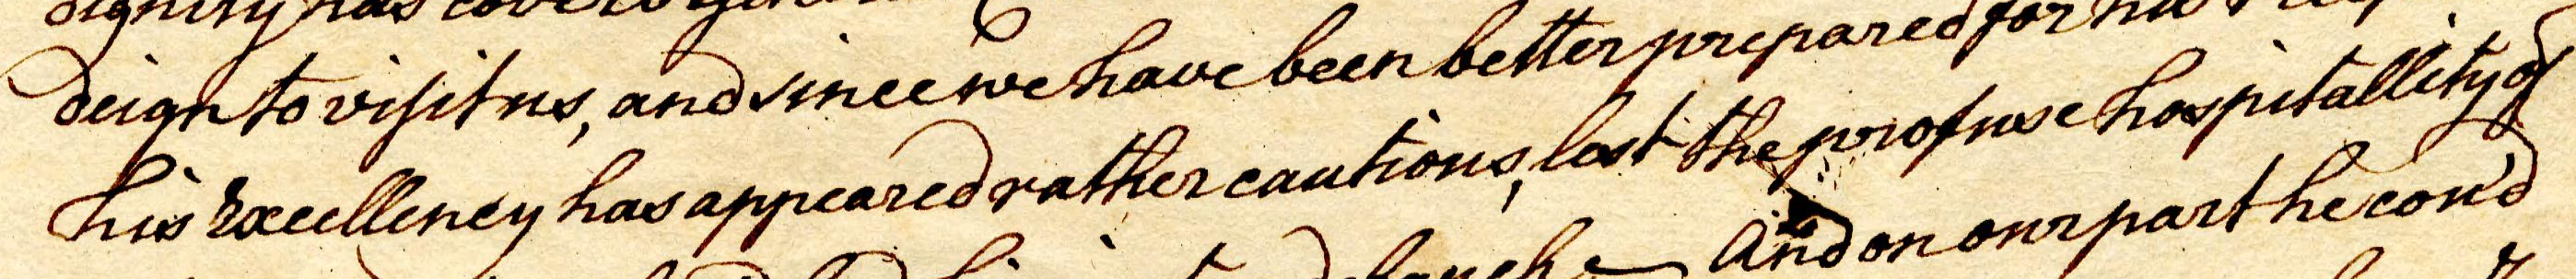his Excellency has appeared rather cautious, lest the profuse hospitality of
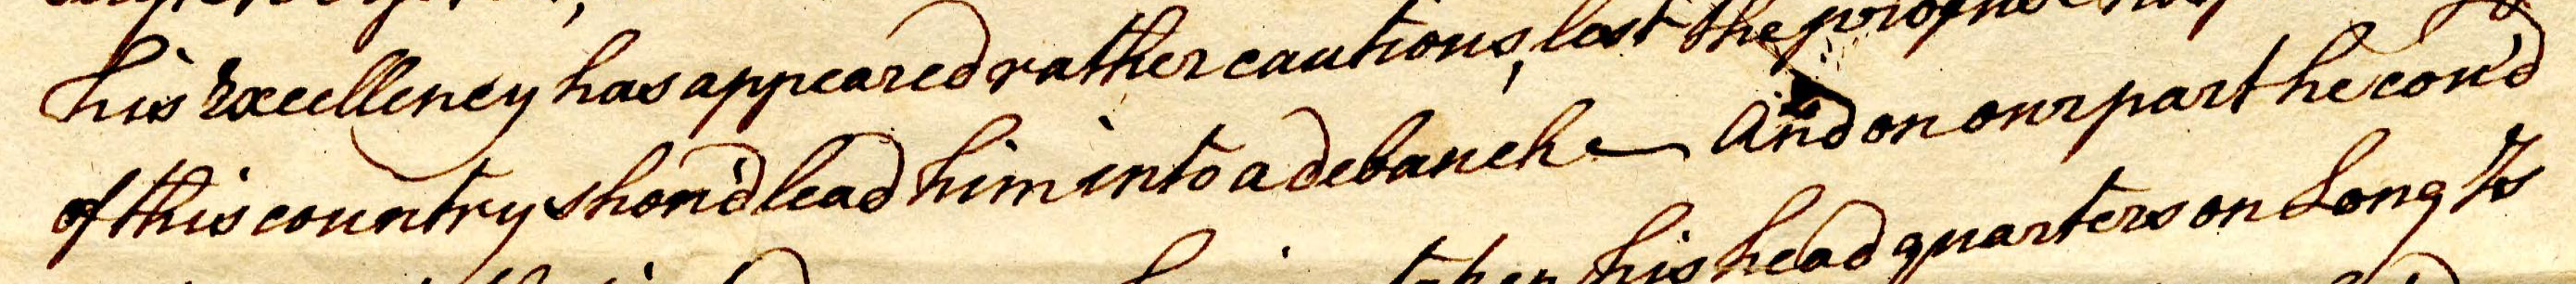of this country shou'd lead him into a debauch- And on our part he cou'd
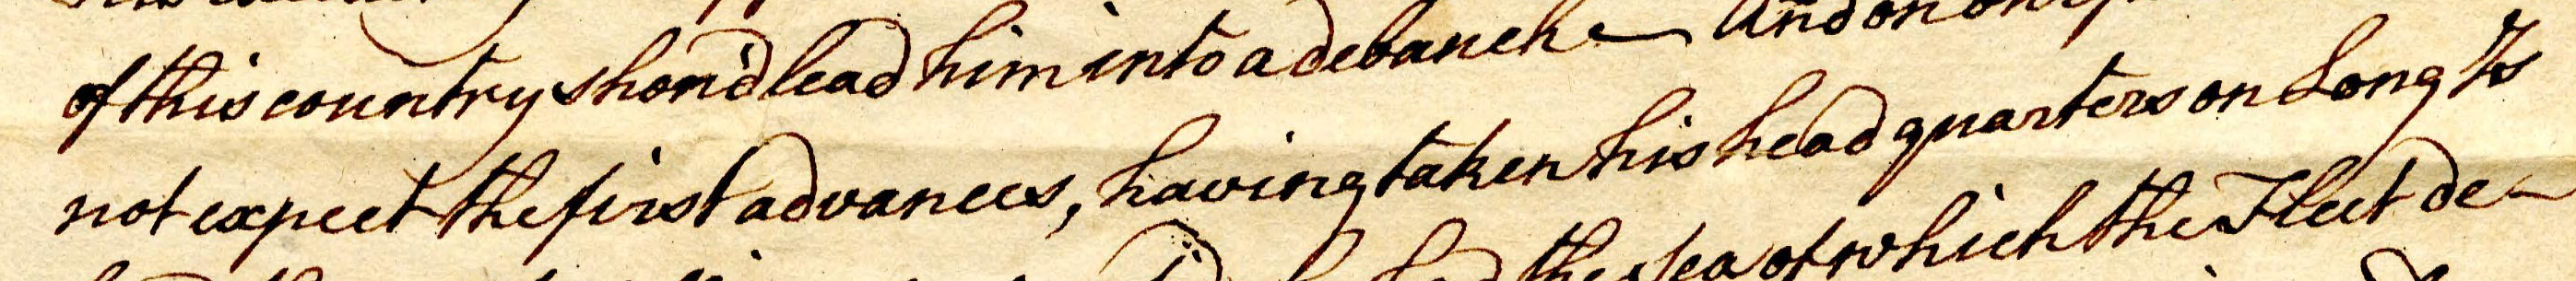not expect the first advances, having taken his head quarters on Long Is
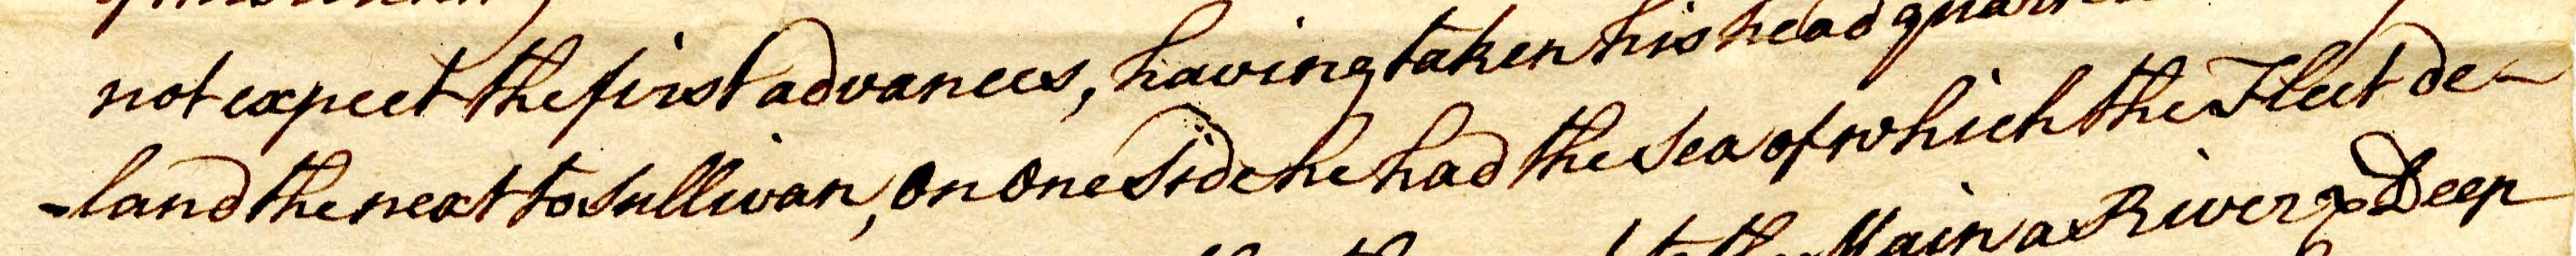-land the next to Sullivan, On One side he had the Sea of which the Fleet de-
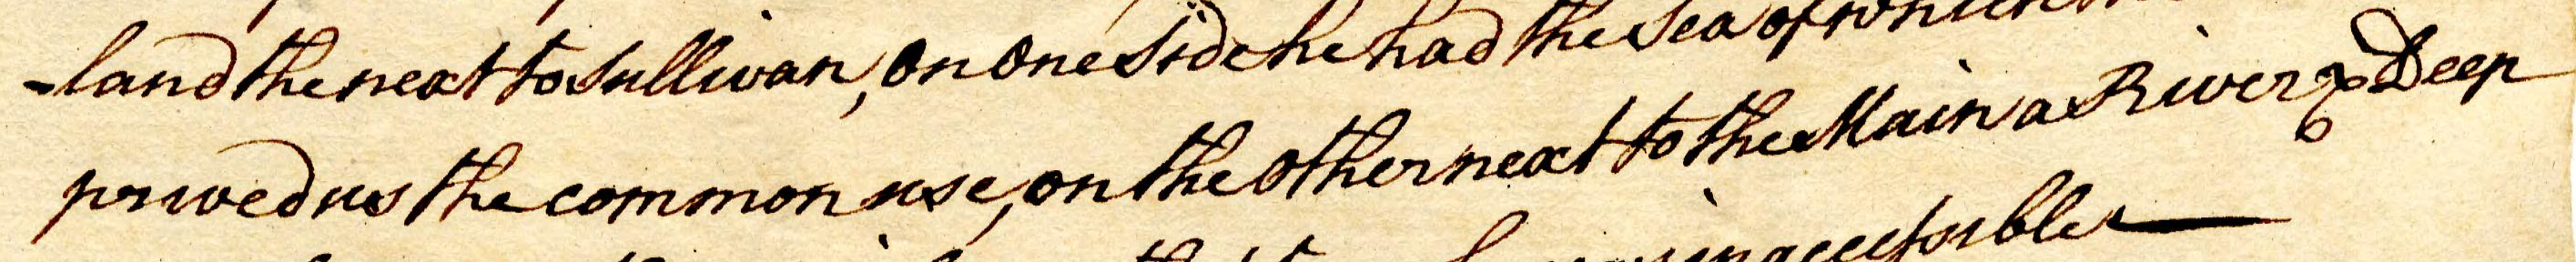prived us the common use, on the other next to the Main a River Deep
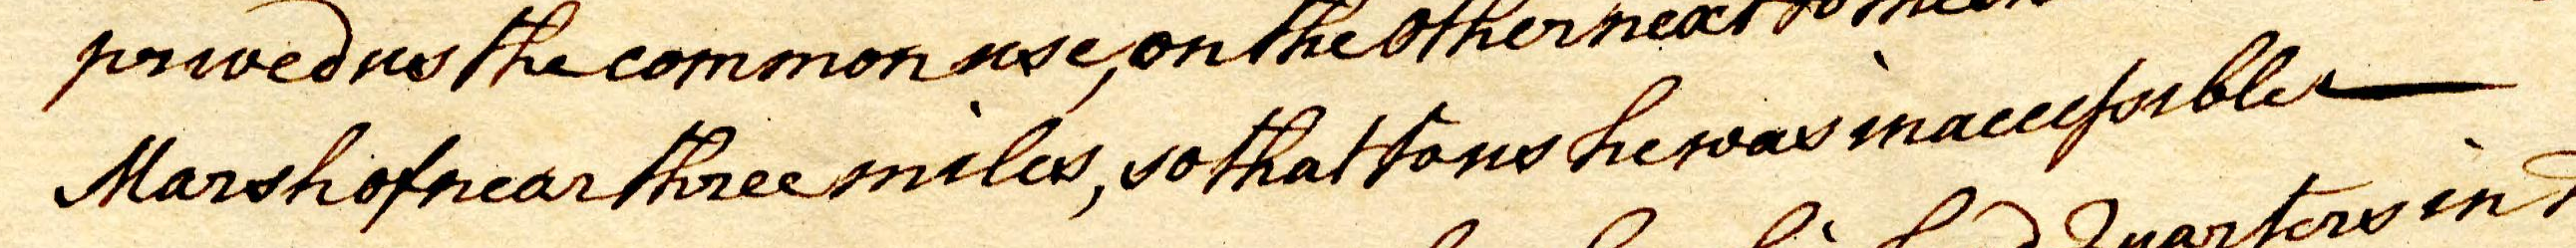Marsh of near three miles, so that to us he was inaccessible
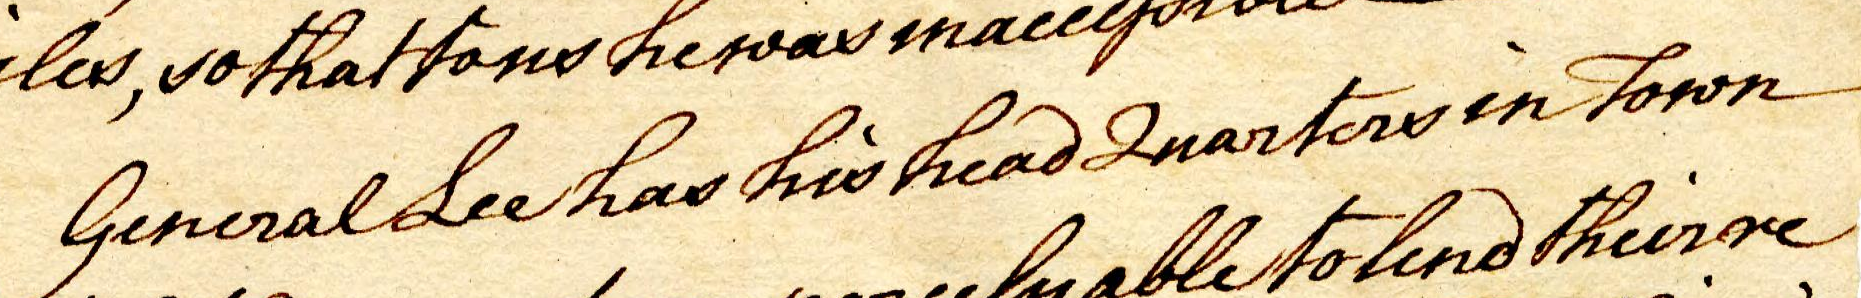General Lee has his head Quarters in town
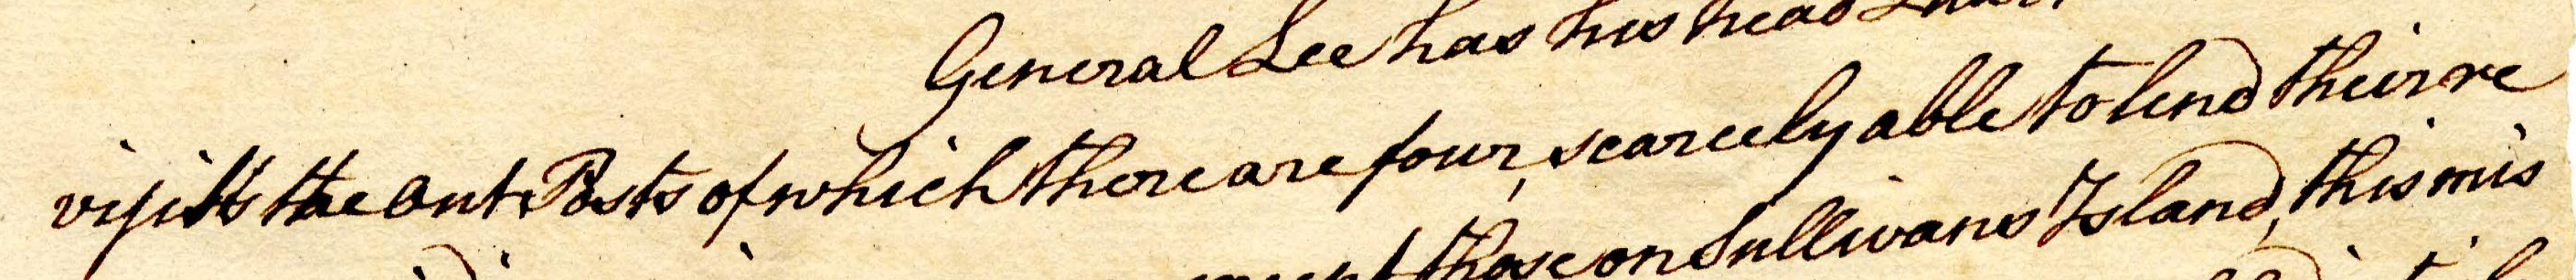visitts the Ante Posts of which there are four, scarcely able to lend their re
